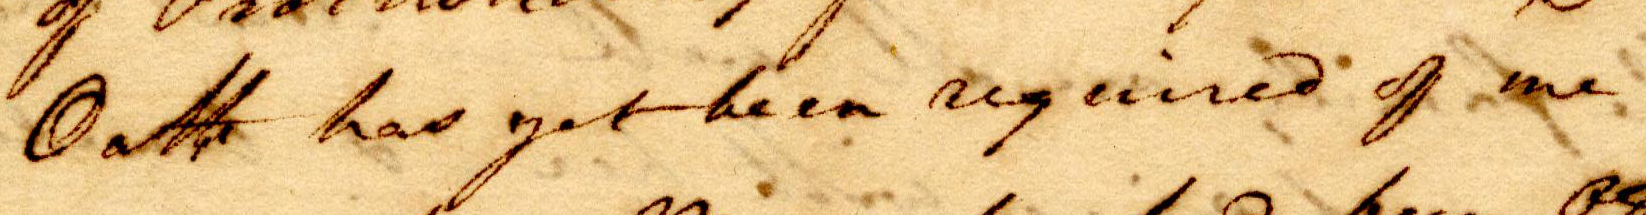Oath has yet been required of me.
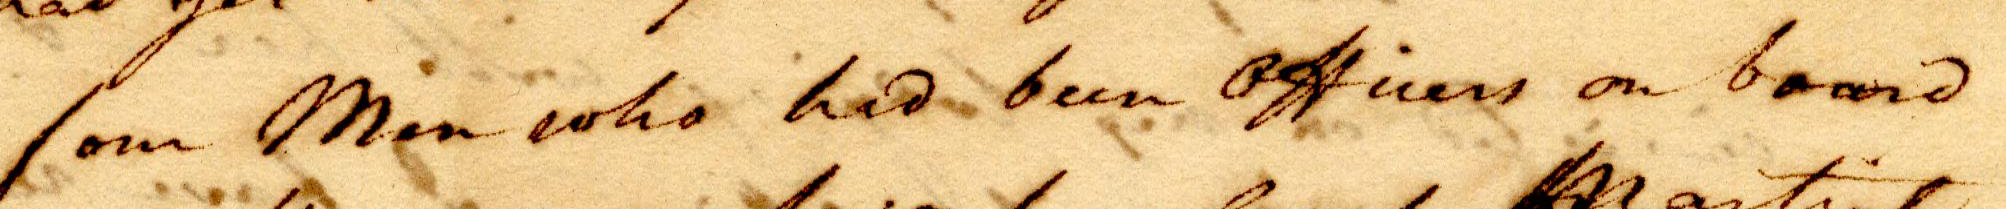four Men who had been Officers on board
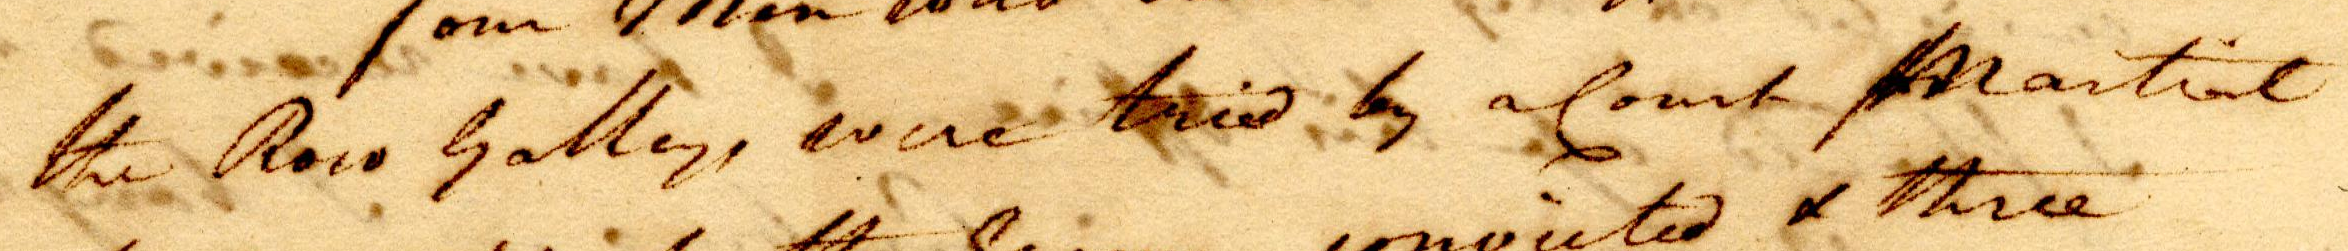the Roco Galleys were tried by a Court Martial
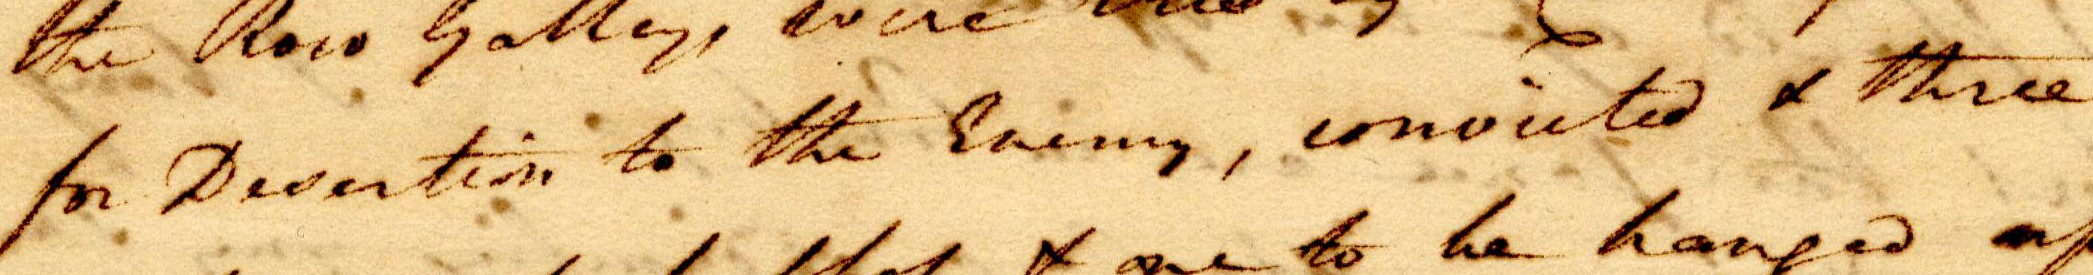for Desertion to the Enemy, convicted & three
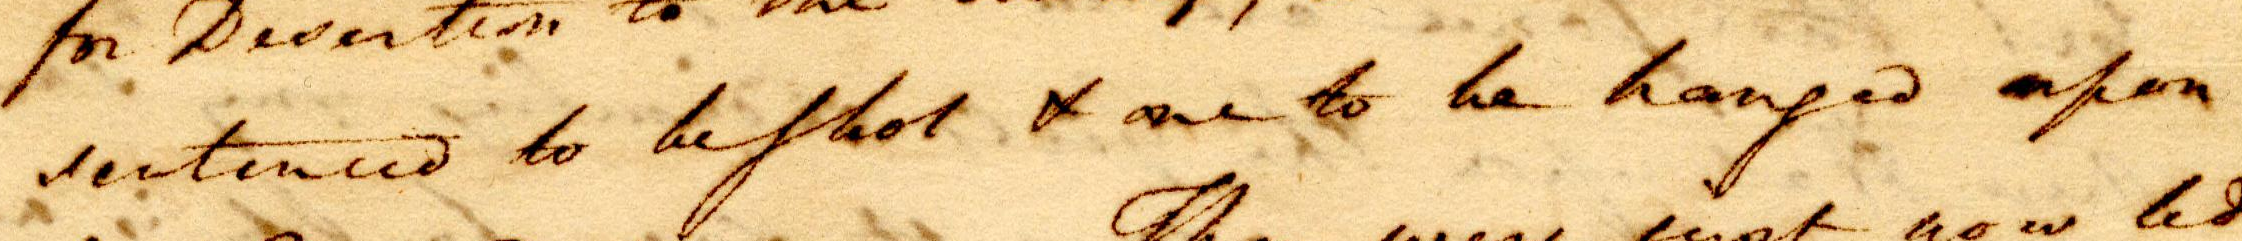sentenced to be shot & are to be hanged upon
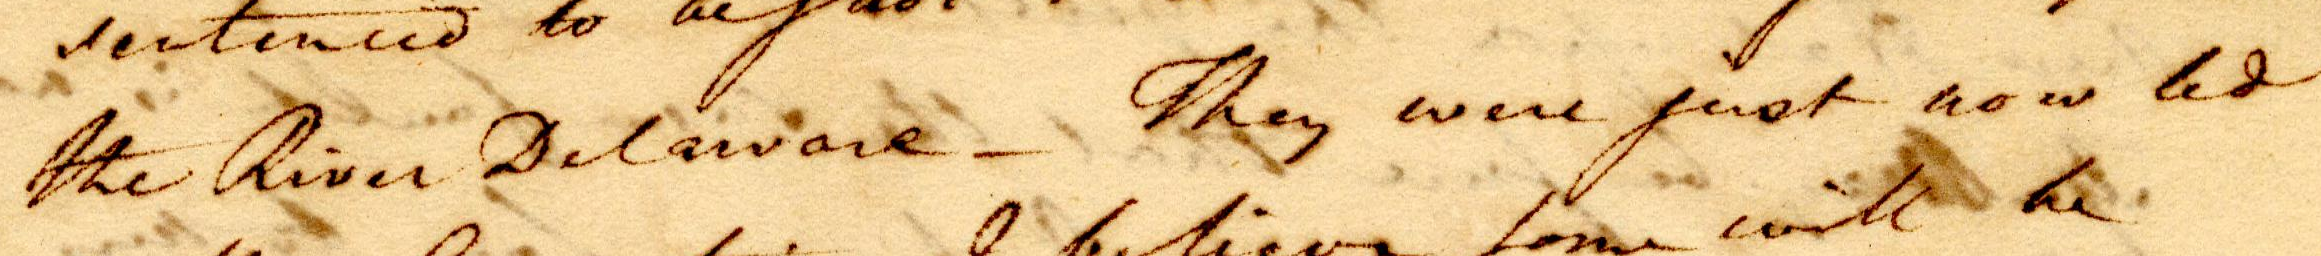the River Delaware. They were just now led
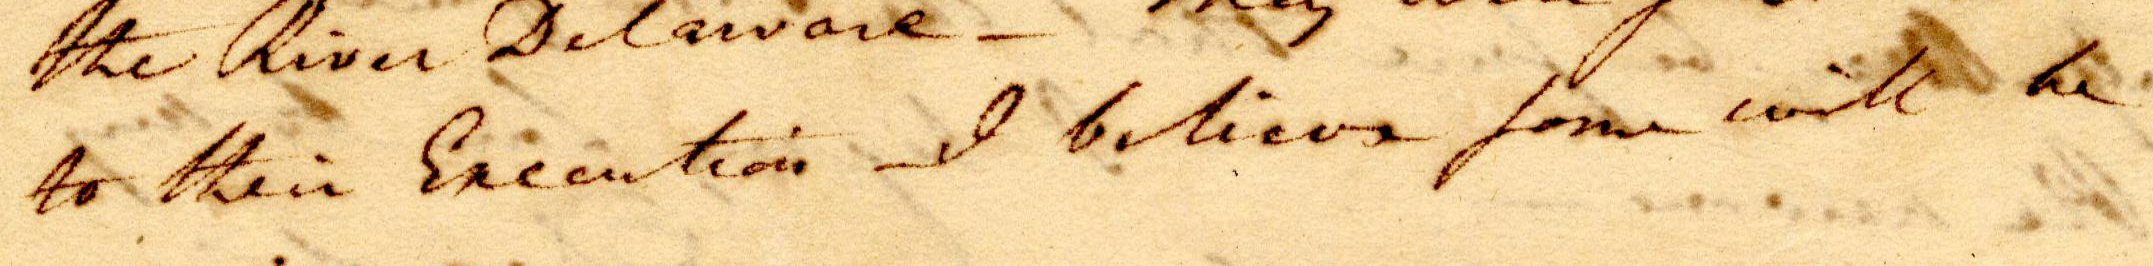to their Execution. I believe some will be
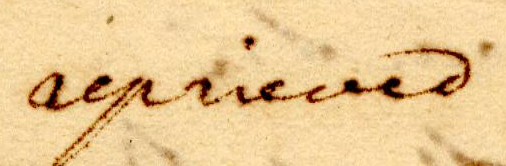reprieved.
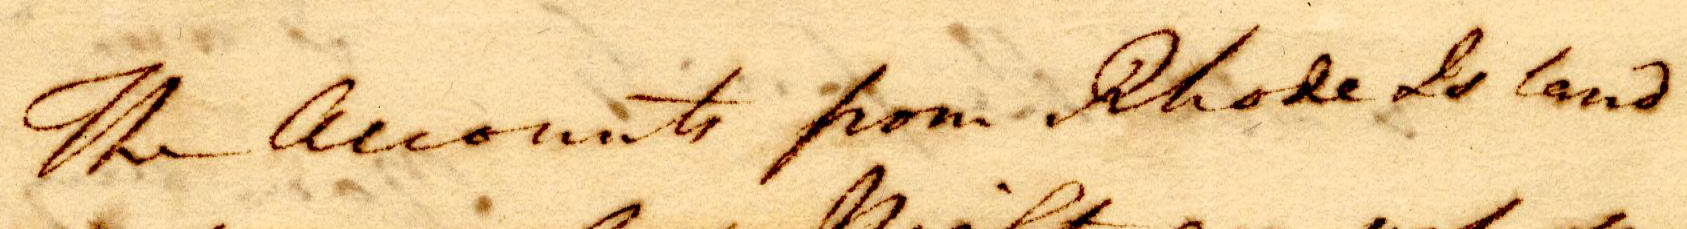The Accounts from Rhode Island
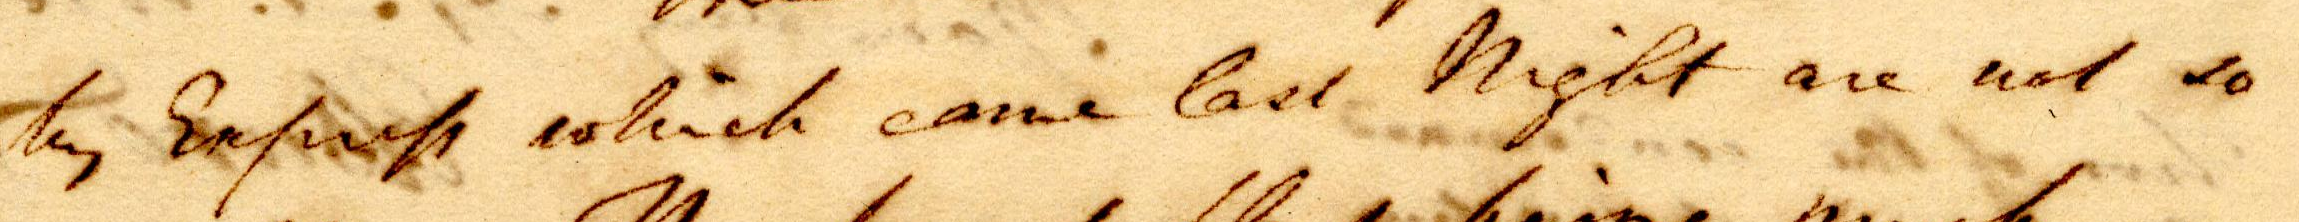by Express which came last Night are not so
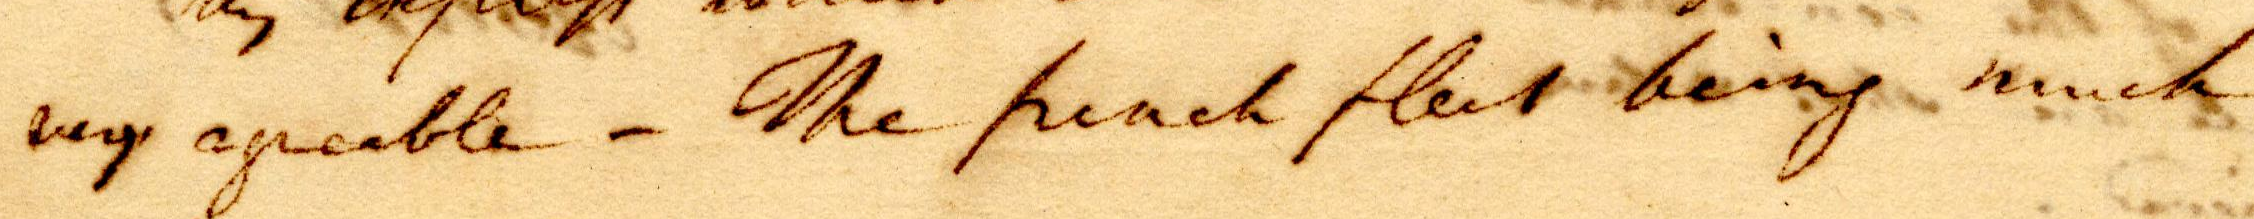very agreable. The peach fleet being much
